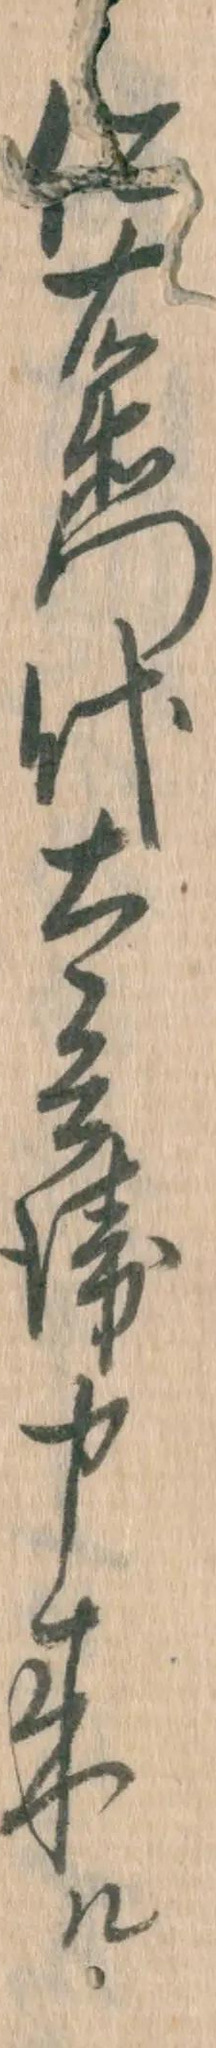仁右衛門代太兵衛申来ル
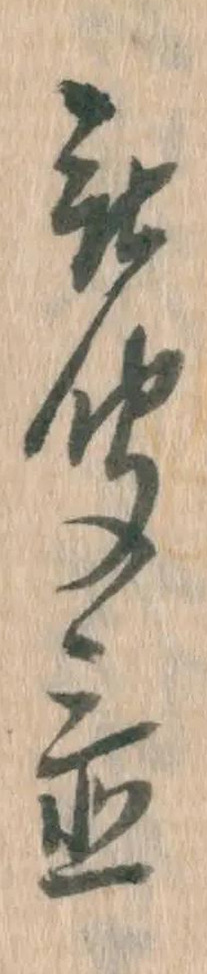被聞置
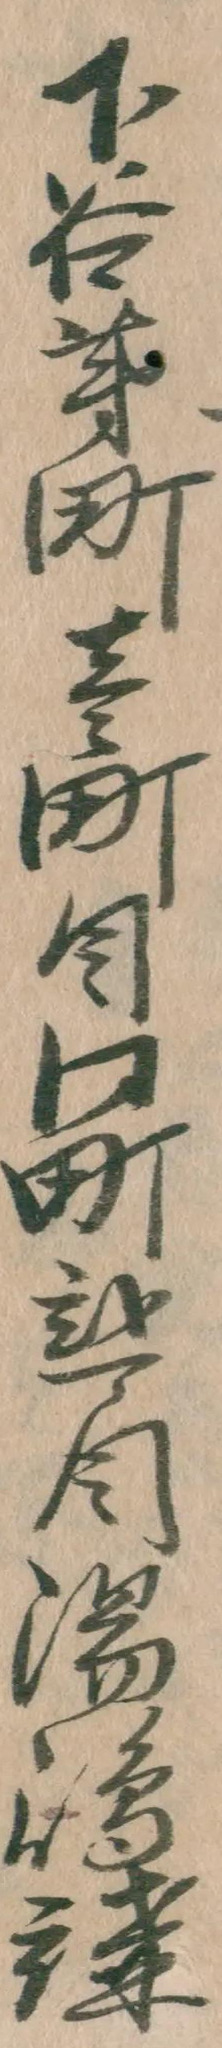下谷茅町壱町目同町弐丁目湯嶋講
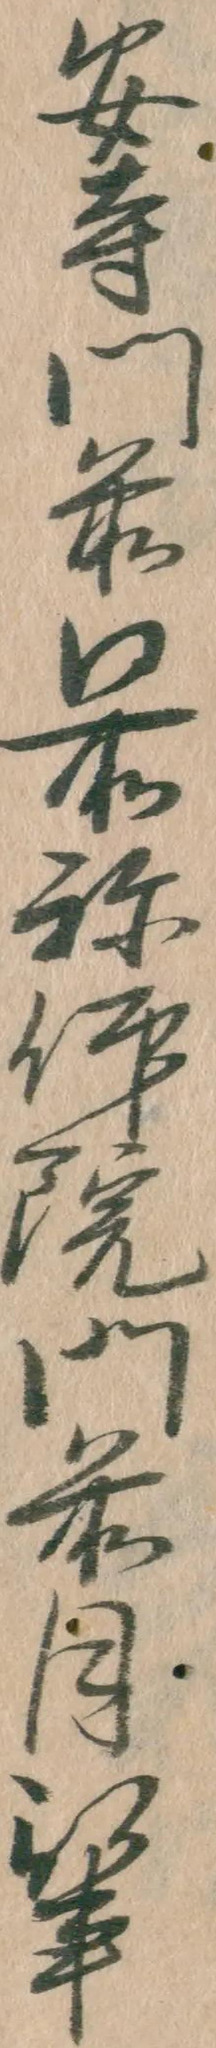安寺門前同所称仰院門前月行事
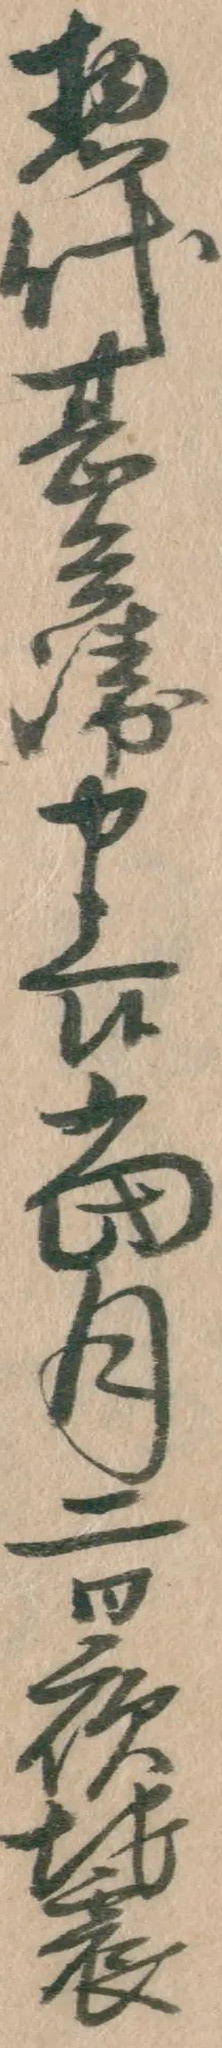惣代甚兵衛申上候当月二日夜地震
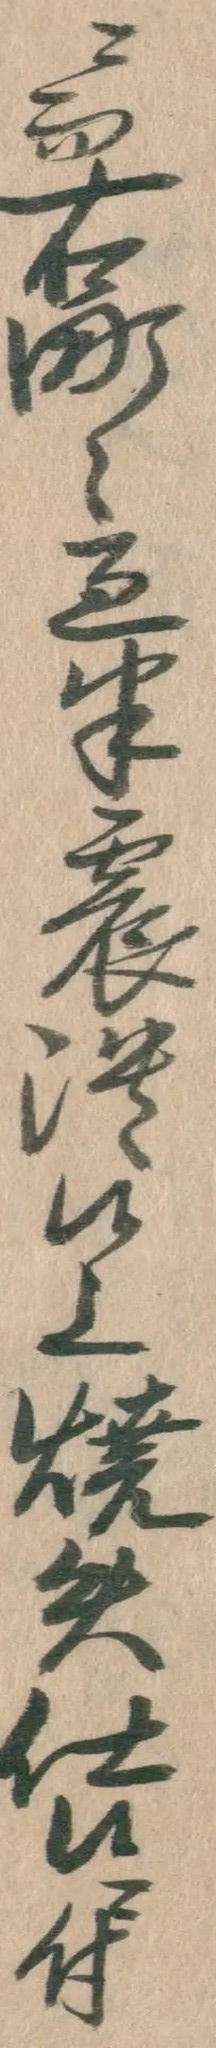ニ而右町々過半震潰候上焼失仕候二付
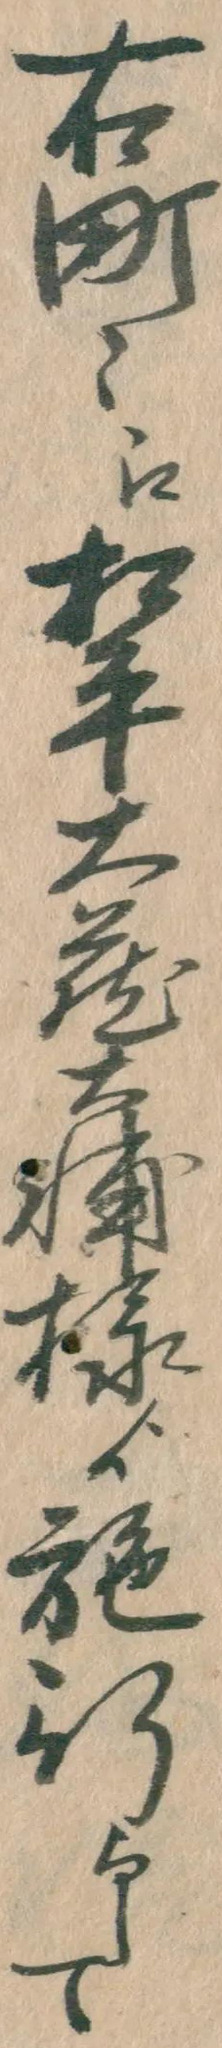右町々え松平大蔵大輔様ゟ施行として
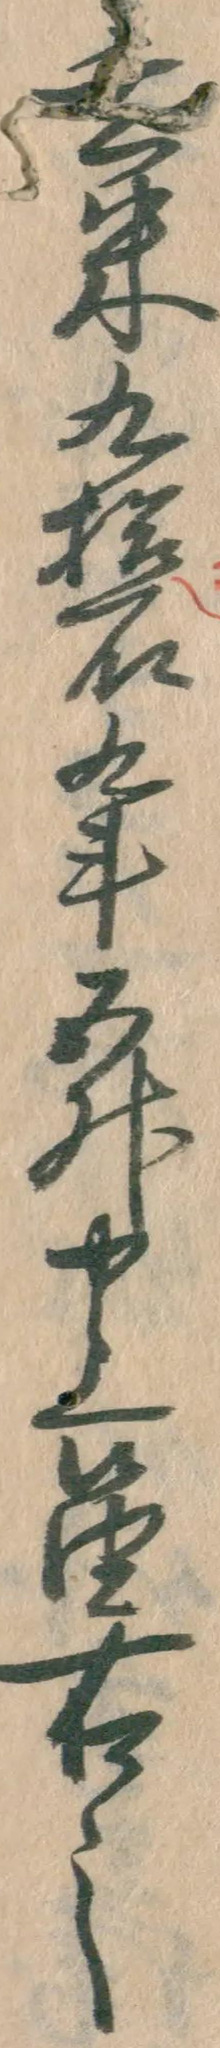玄米九拾九石九斗五升申上候由右之

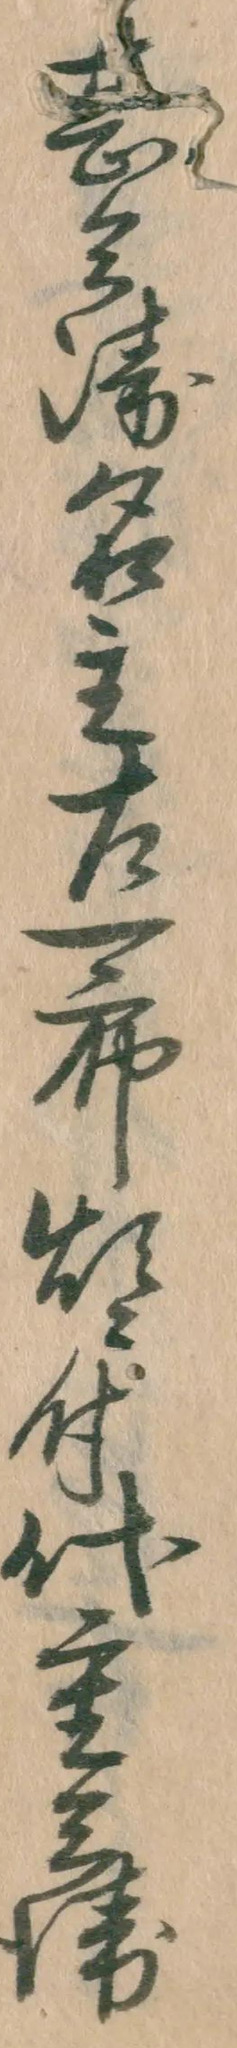甚兵衛名主左一郎煩ニ付代重兵衛
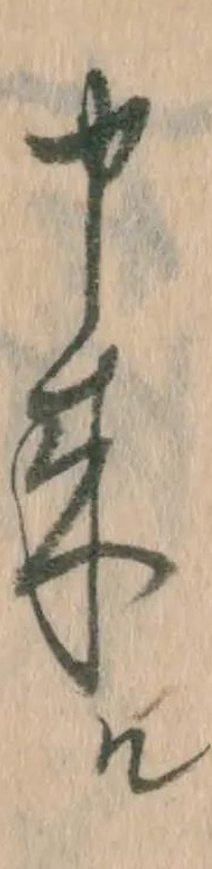申来ル
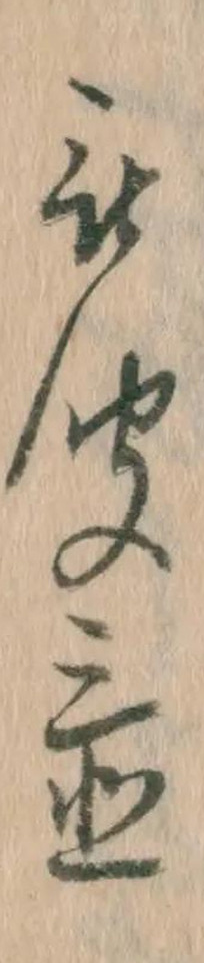被聞置
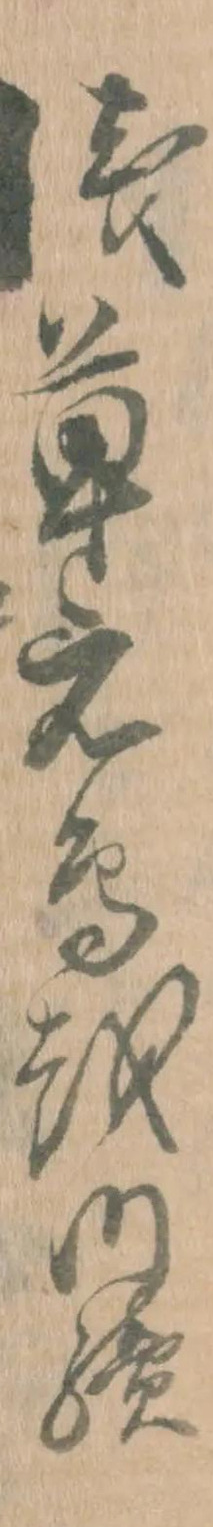浅草元鳥越町続
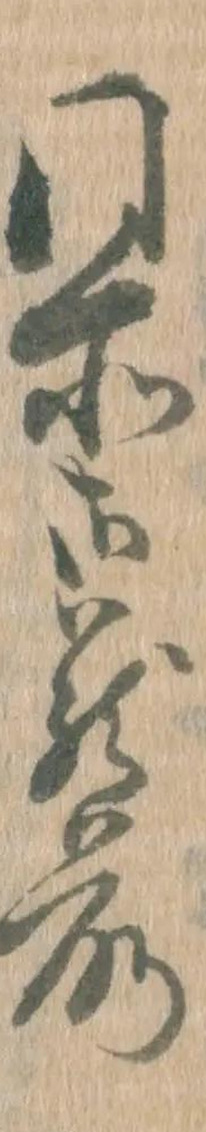同所御蔵前
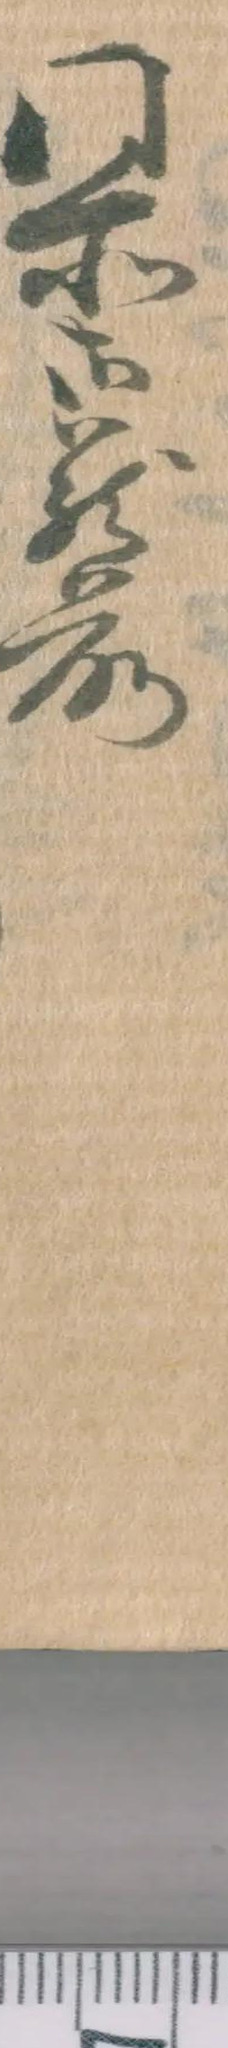同所御蔵前
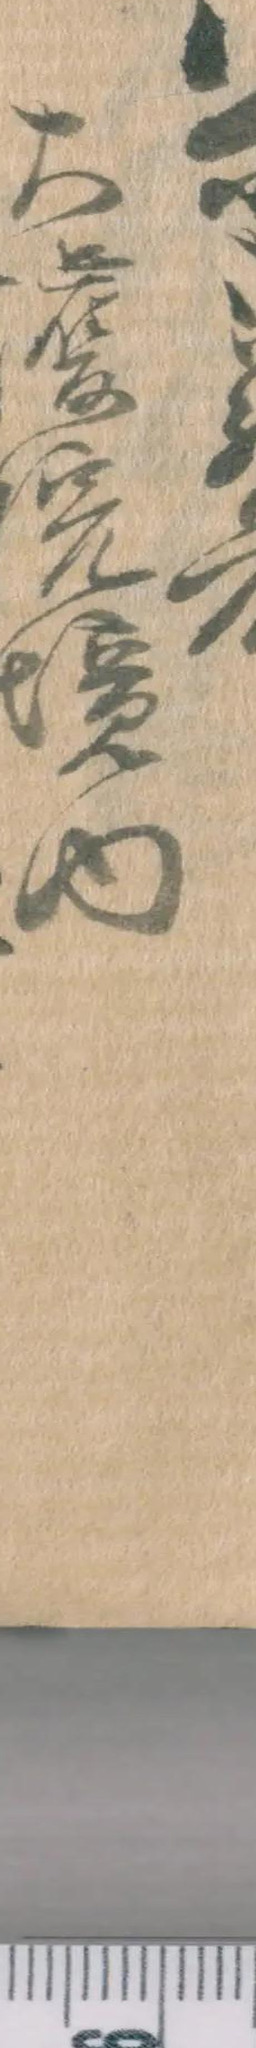大護院境内
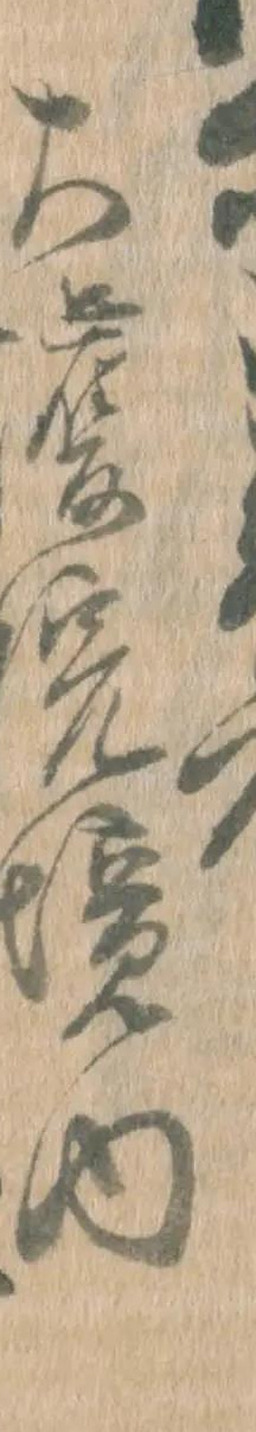大護院境内
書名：武家方并寺院等ニテ施差出候一件
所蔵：国立国会図書館 National Diet Library, JAPAN
